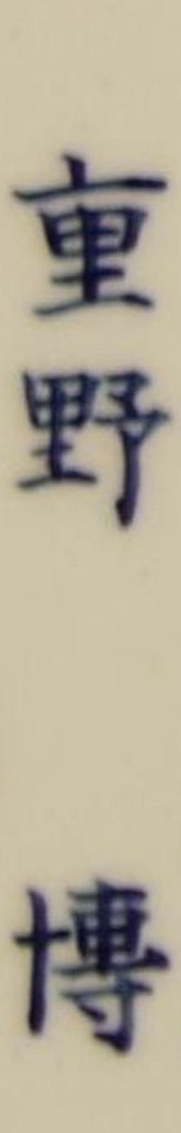重野博
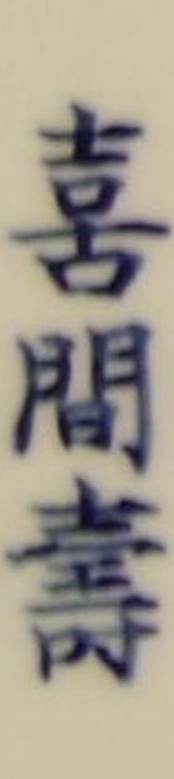喜間壽

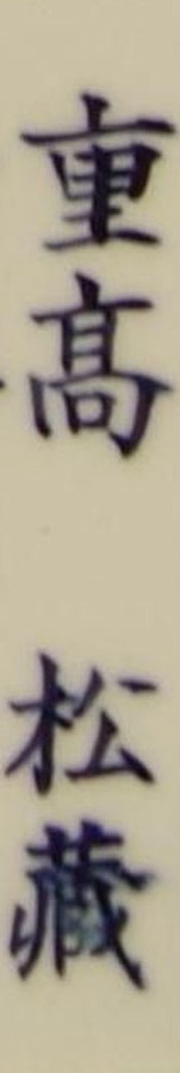重高松蔵
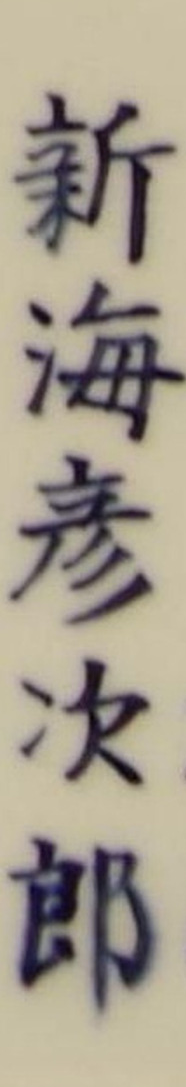新海彦次郎
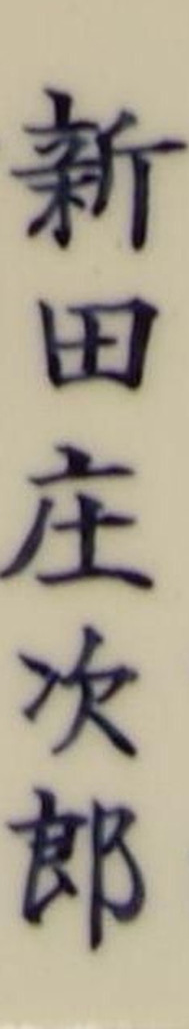新田庄次郎
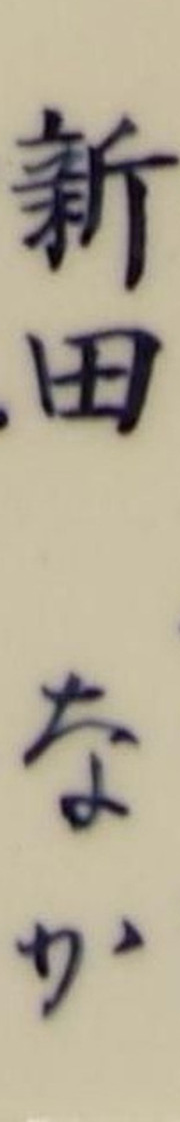新田なか
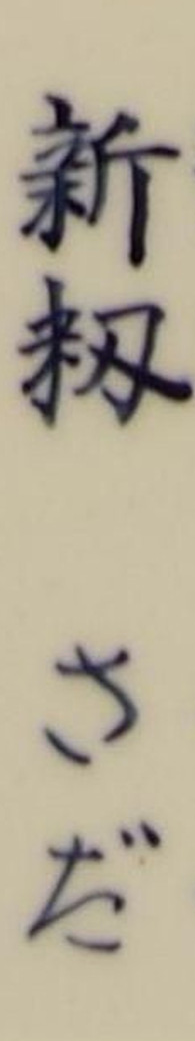新籾さだ
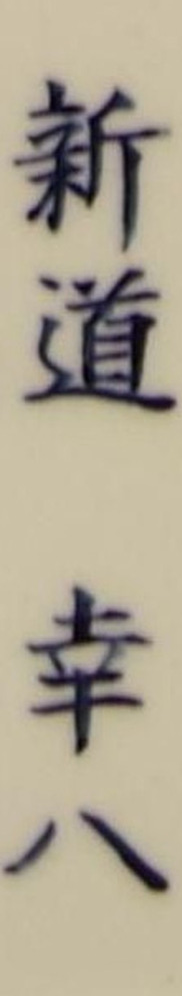新道幸八
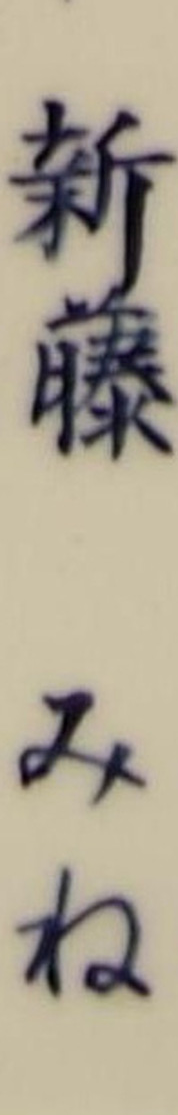新藤みね
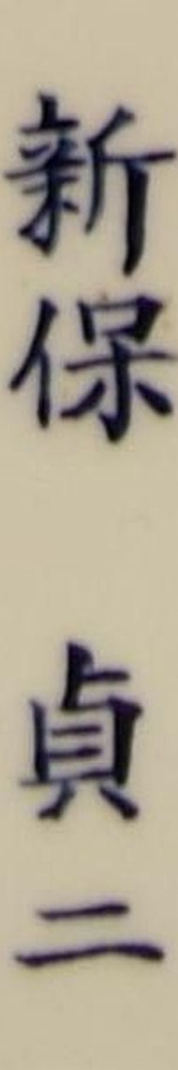新保貞二
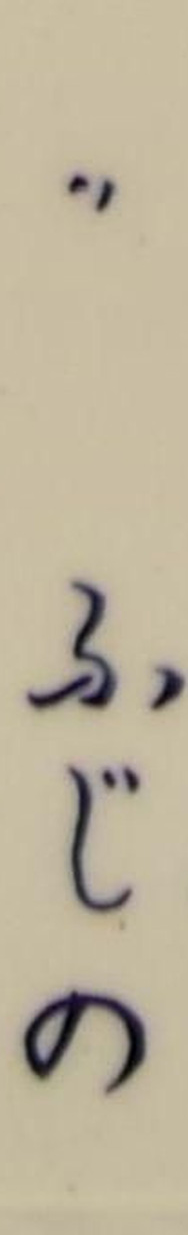ふじの
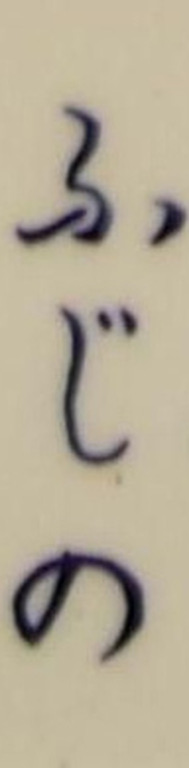ふじの
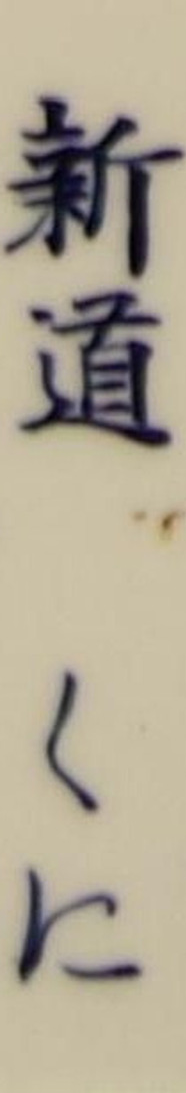新道くに
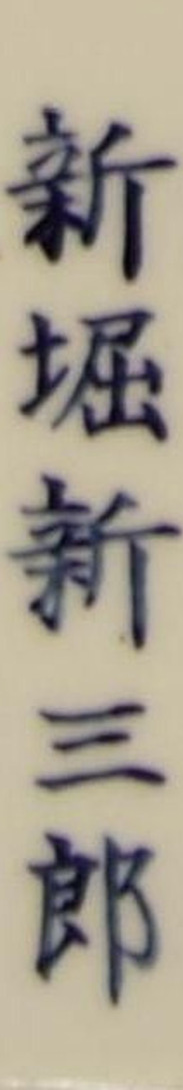新堀新三郎
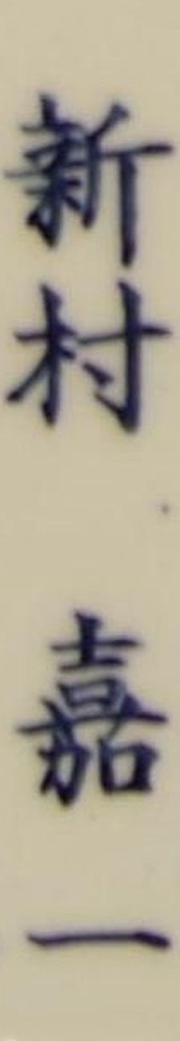新村嘉一
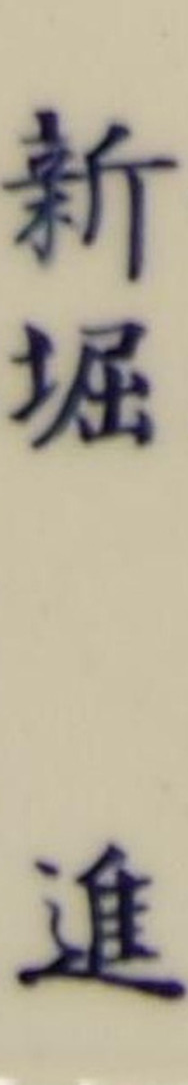新堀進
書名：A~D
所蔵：koyasan kongobuji
